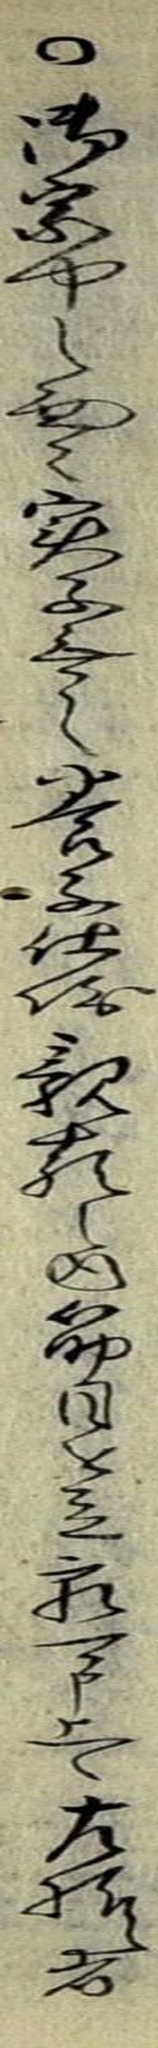〇御家中之面々実子無之養子仕儀親類之内筋目を立願可申上候左様之者
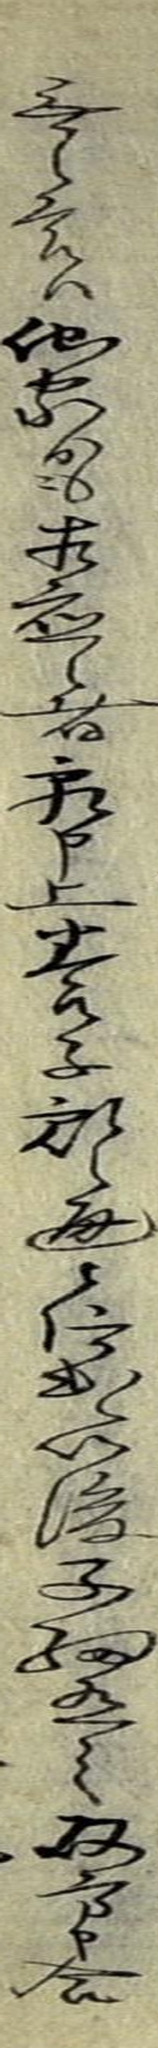無之節ハ他家ゟも相応之者願申上養子願之通被仰出候以後子細有之双方申合
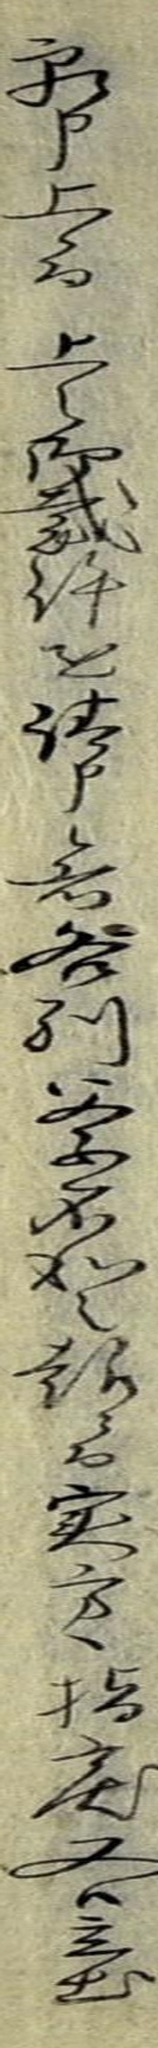願申上候而上之御裁許を請申候者各別父子不和之趣ニ而実方へ指戻又ハ立出
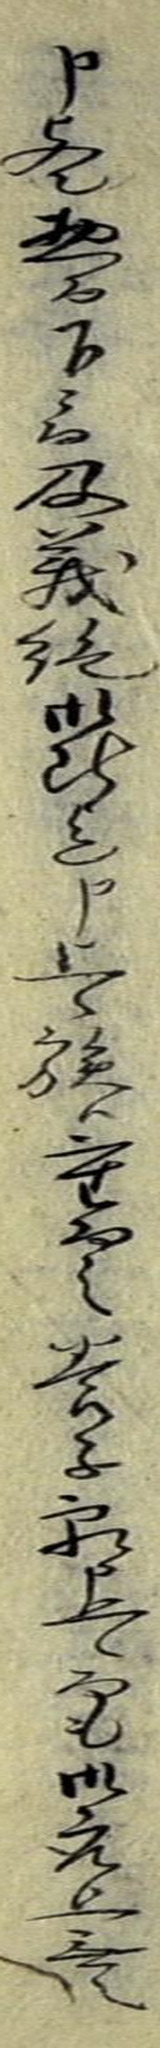申歟惣而下ニ而及義絶御断迄申上候族ハ重而之養子願申上候而も御取上無之

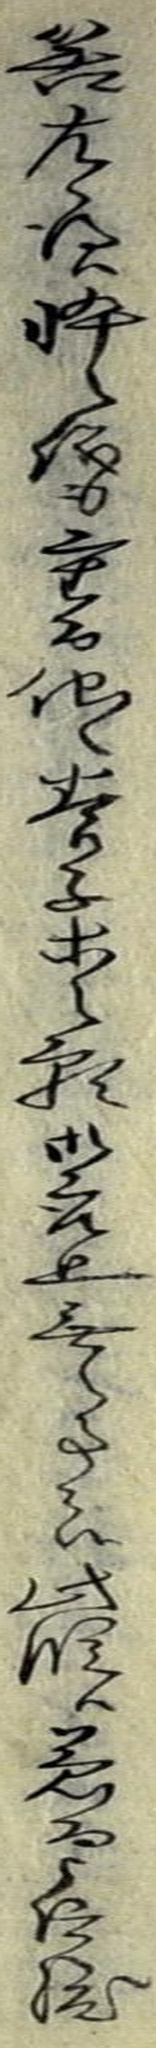筈左候得ハ忰之儀も重而他へ養子等之願御取上無之事ニ候此段ハ兼而被仰渡
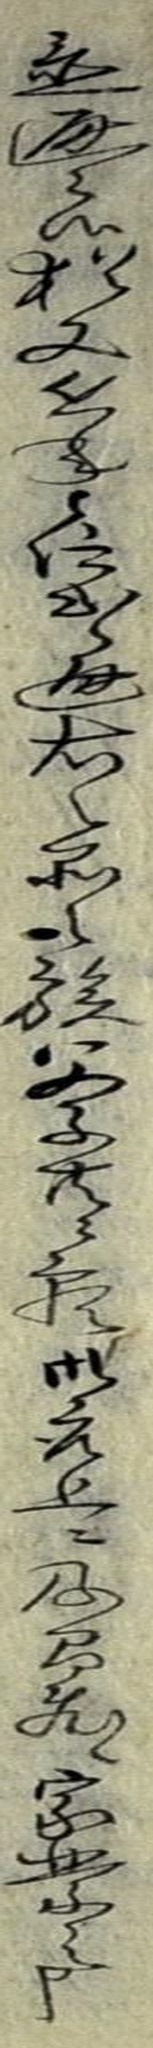置通ニ候猶又近年被仰出候通右之品之族父子共ニ願御取上ニ及間敷候家業之申
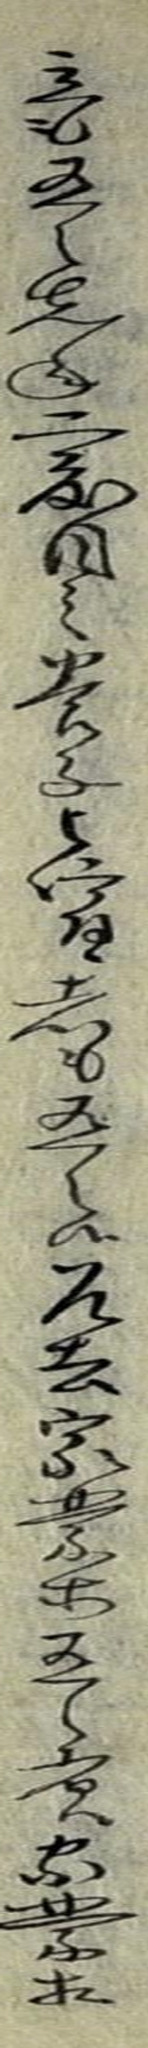立も有之先年二度目之養子被仰付候者も有之候乍去家業等有之者ハ家業相
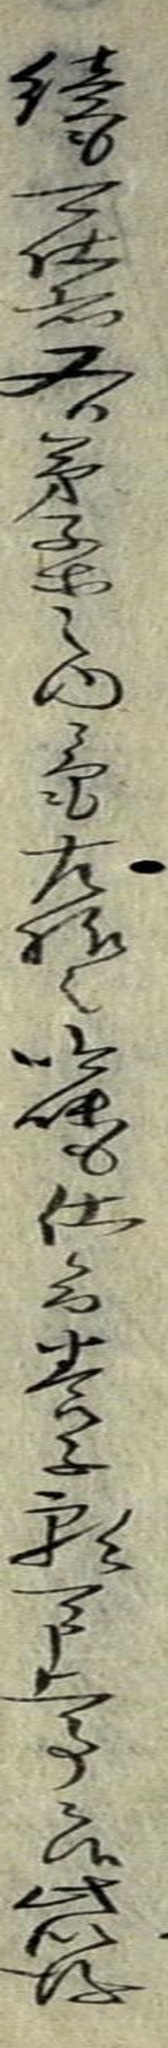続も可仕者又ハ弟子等之内ニ而も左様之吟味も仕候而養子願可申上事ニ候此以後
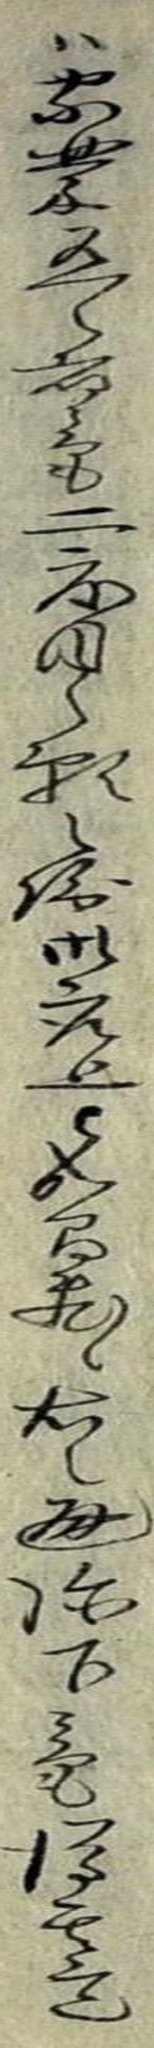ハ家業有之者ニ而も二度目之願之儀御取上被成間敷候右之通弥下ニ而も得其意
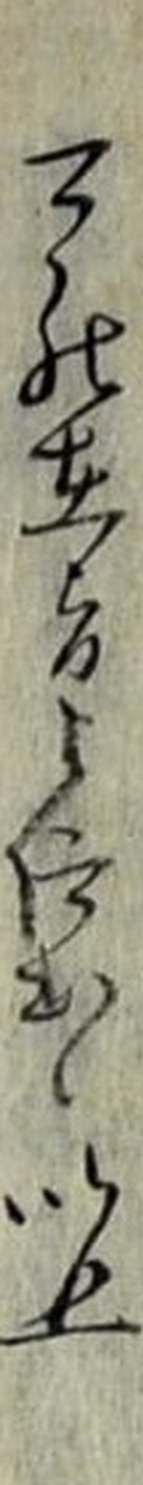可罷在旨被仰出候以上
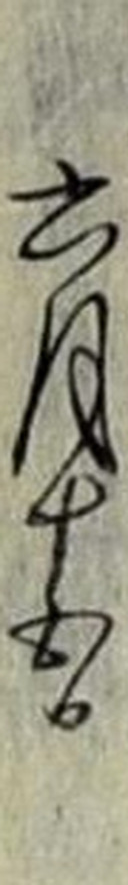六月十五日
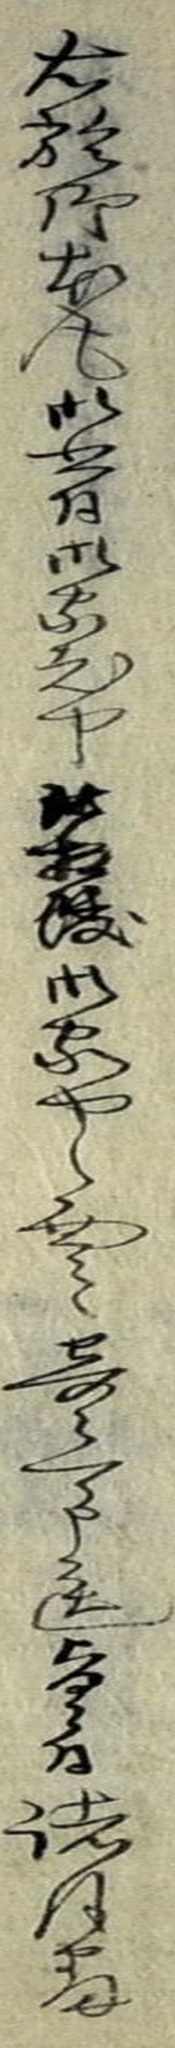右於御本丸御書付御家老中被相渡御家中之面々寄々可申送旨ニ付諸月番
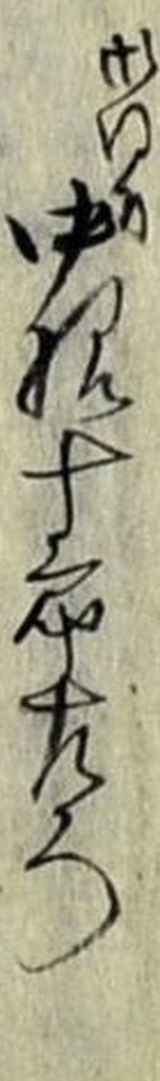覚御目付中根十郎左衛門
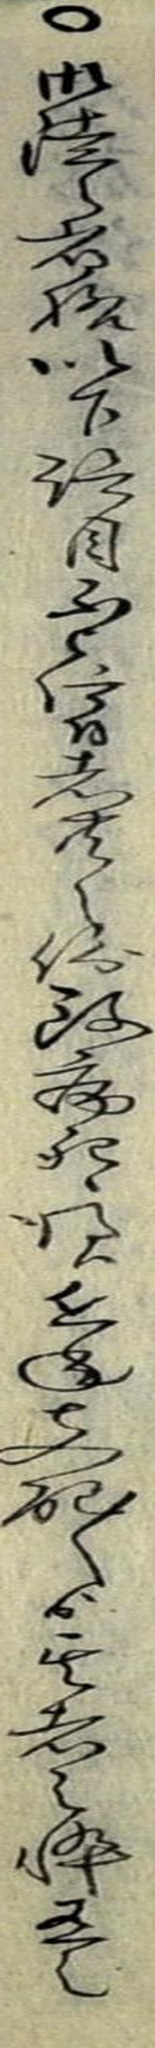〇御徒之者格以下跡目不被仰付者共之儀致病死候得ハ近年支配〳〵ゟ其者之忰有之
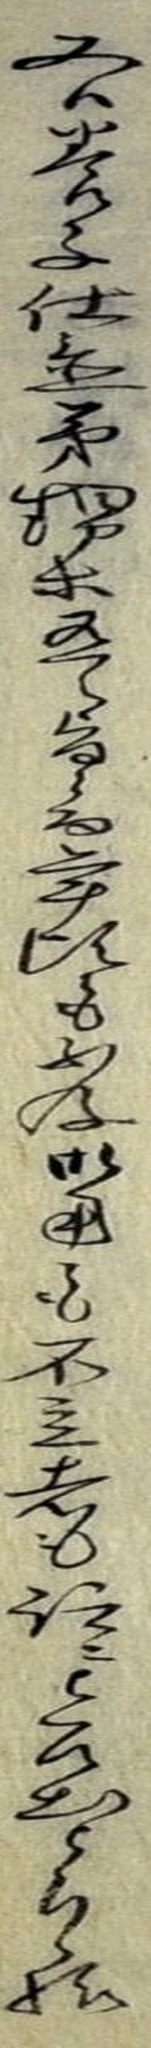又ハ養子仕置弟甥等有之旨ニ而年頃も不及御用ニも不立者も跡ニ被召出被下候様
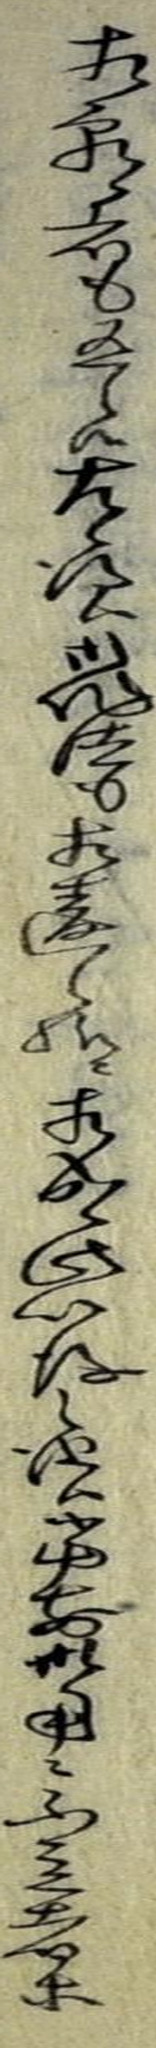相願候者も有之候左候得ハ御作法も相違候様ニ相成候此以後之儀ハ当前御用ニ不立者等
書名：命令之部 一
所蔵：福井県文書館 Fukui Prefectural Archives
